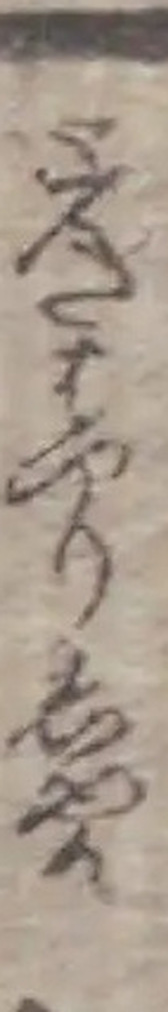とんたはやりしやか
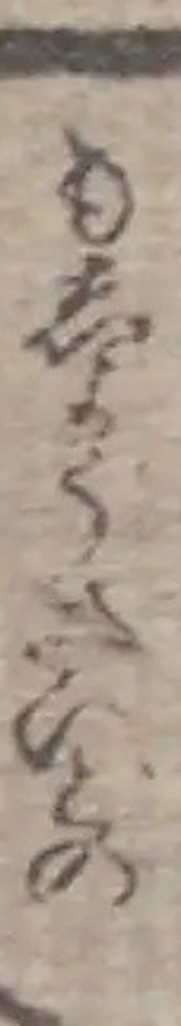もしようさいどの
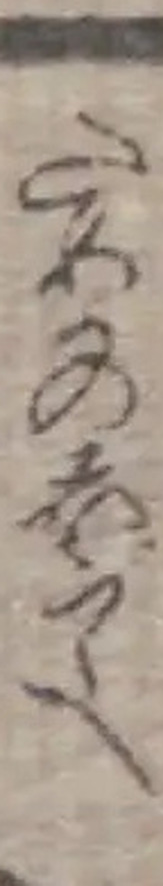ためこのしこくへ
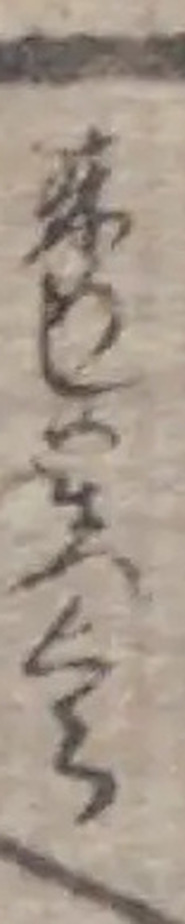来りしめまへくら
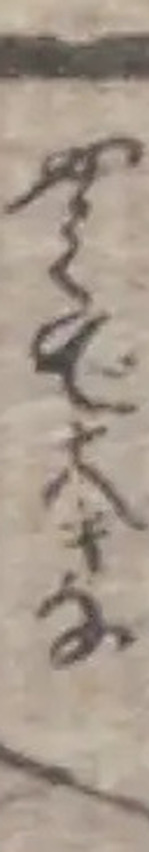やみで大きな
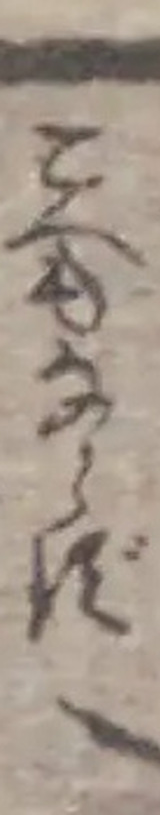こへもならず
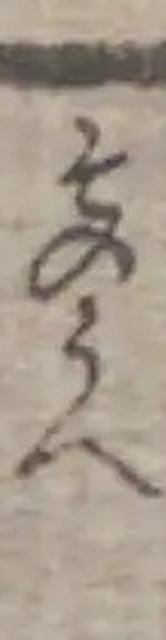そのうへ
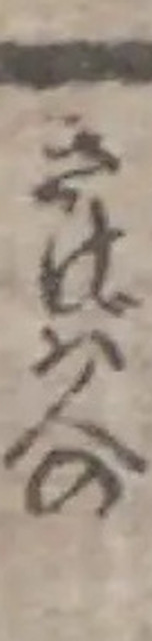きけば人の
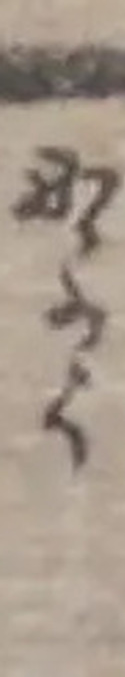によう
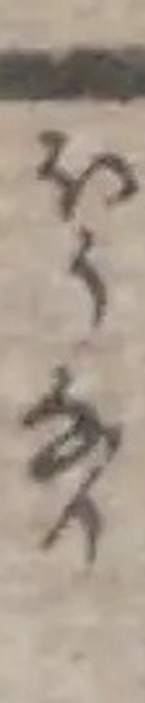ほうなり
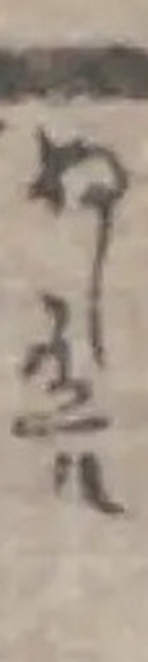ぬし有る
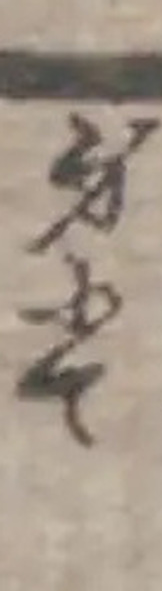身にて
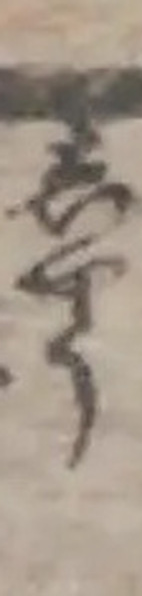しやう
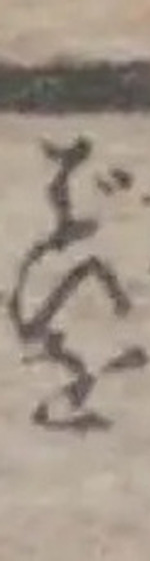ばいを
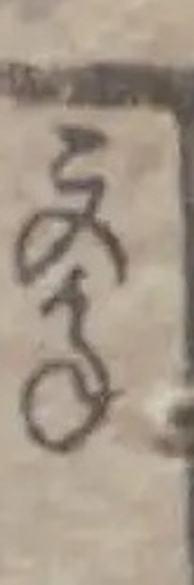このかね
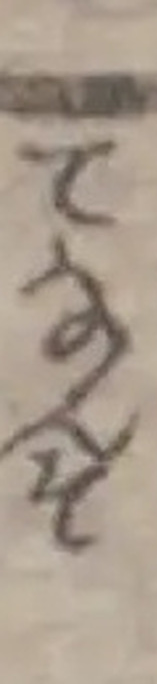てなんそ
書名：早出来 3巻
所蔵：国立国会図書館 National Diet Library, JAPAN
